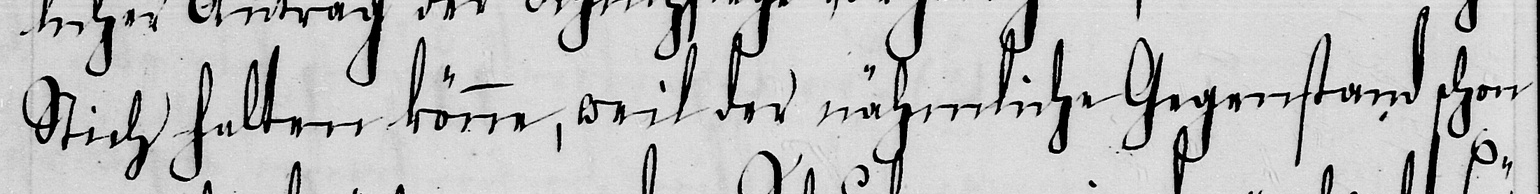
Stich halten könne, weil der nähmliche Gegenstand schon
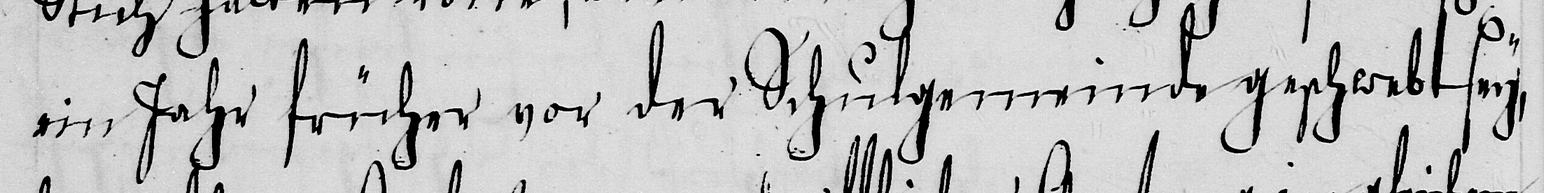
ein Jahr früher vor der Schulgemeinde geschwebt sey,
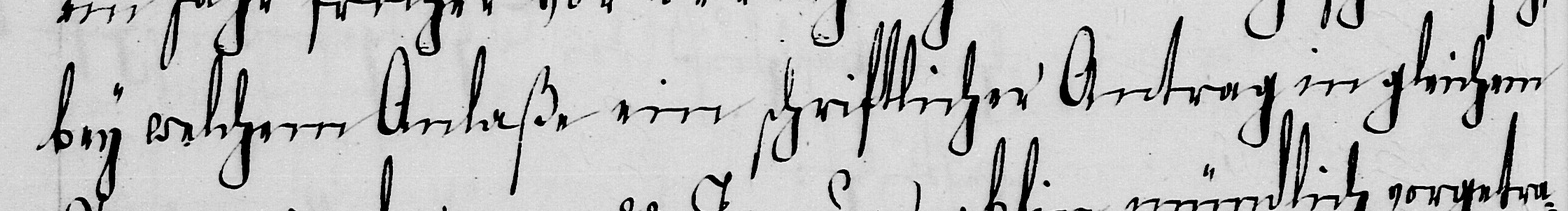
bey welchem Anlaße ein schriftlicher Antrag in gleichem
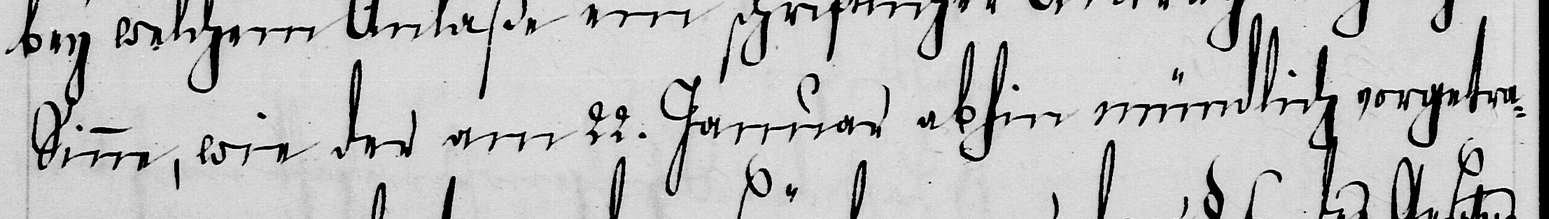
Sinne, wie der am 22. Januar abhin mündlich vorgetra¬
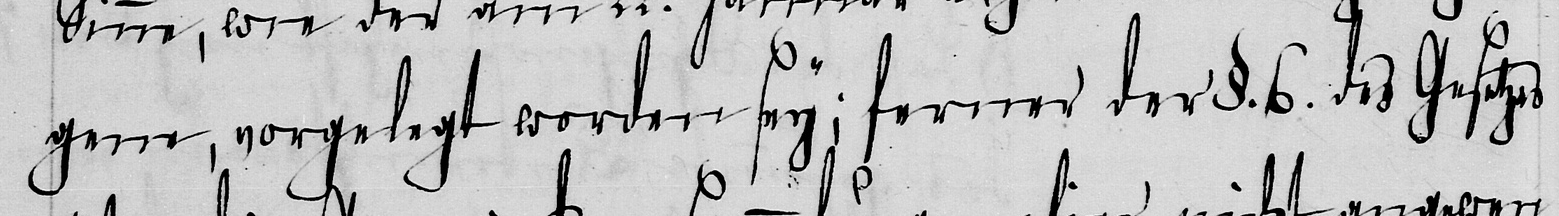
gene, vorgelegt worden sey; ferner der §. 6. des Gesetz¬
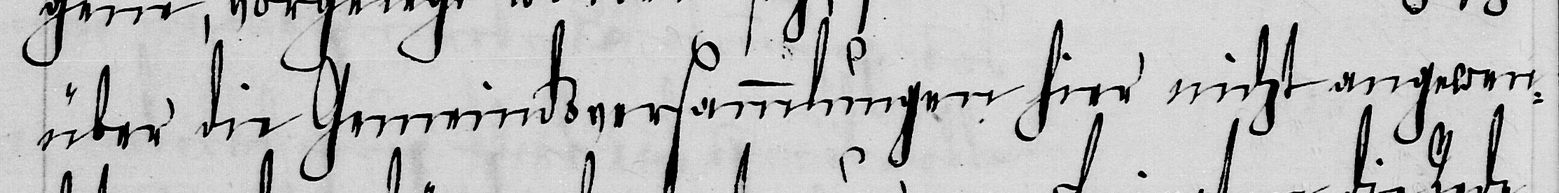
über die Gemeindsversammlungen hier nicht angewen¬
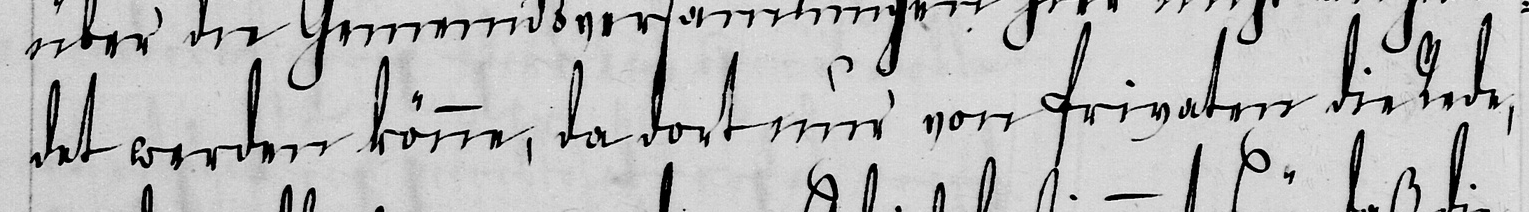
det werden könne, da dort nur von Privaten die Rede,
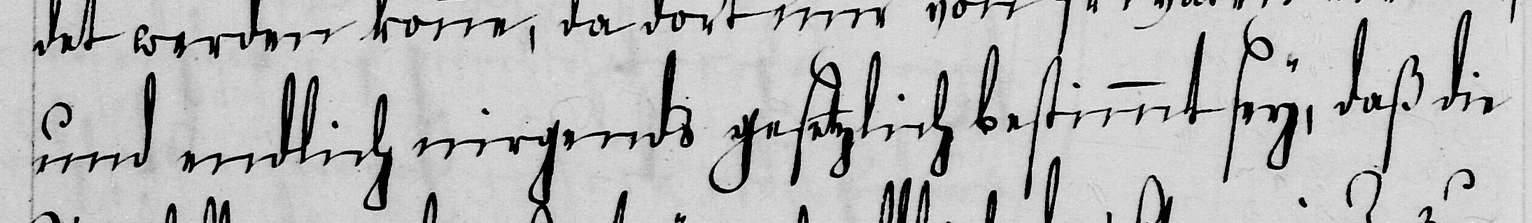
und endlich nirgends gesetzlich bestimmt sey, daß die
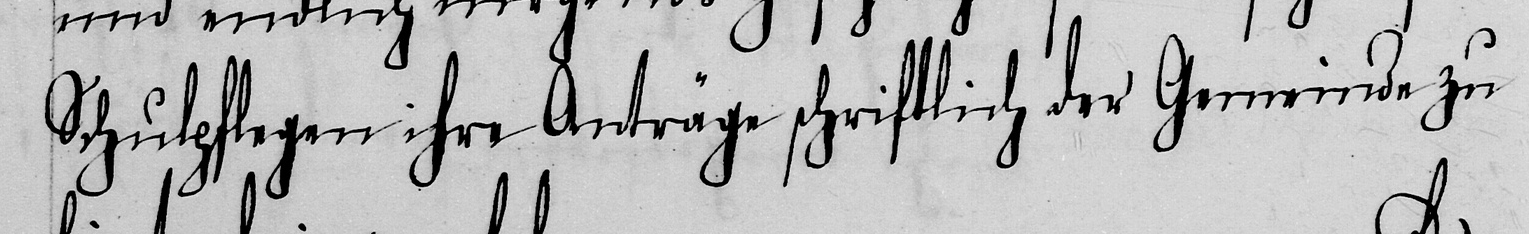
Schulpflege ihre Anträge schriftlich der Gemeinde zu
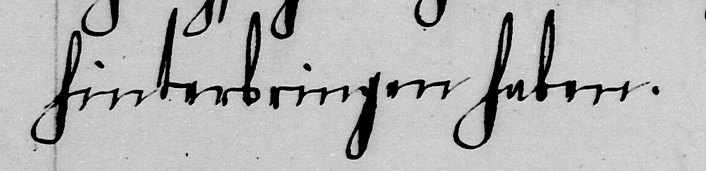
hinterbringen haben.
